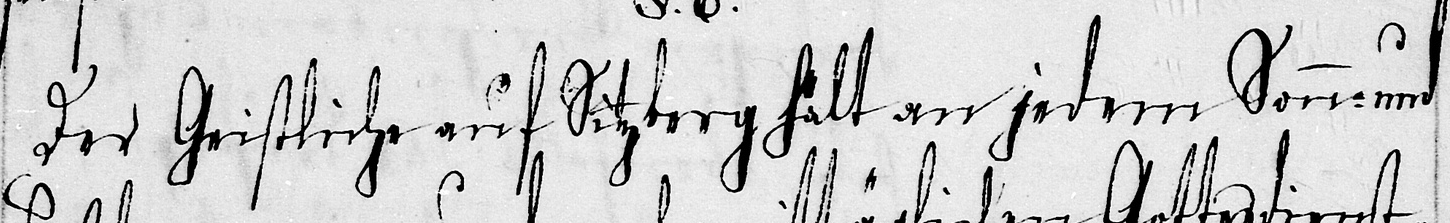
Der Geistliche auf Sitzberg hält an jedem Sonn-
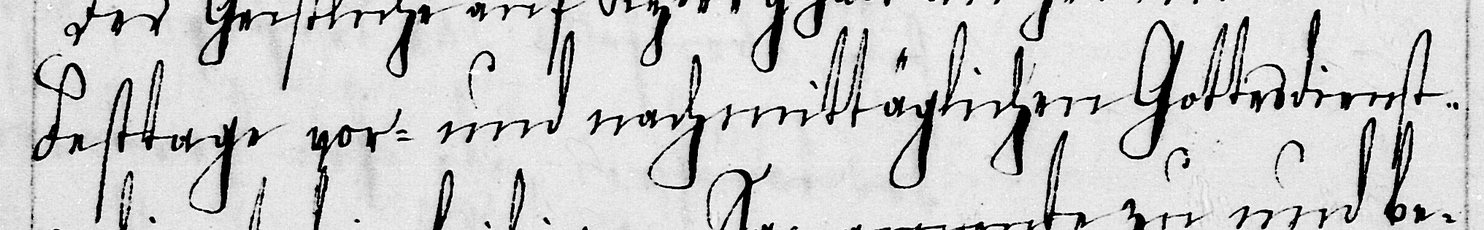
Festtage vor- und nachmittäglichen Gottesdienst.
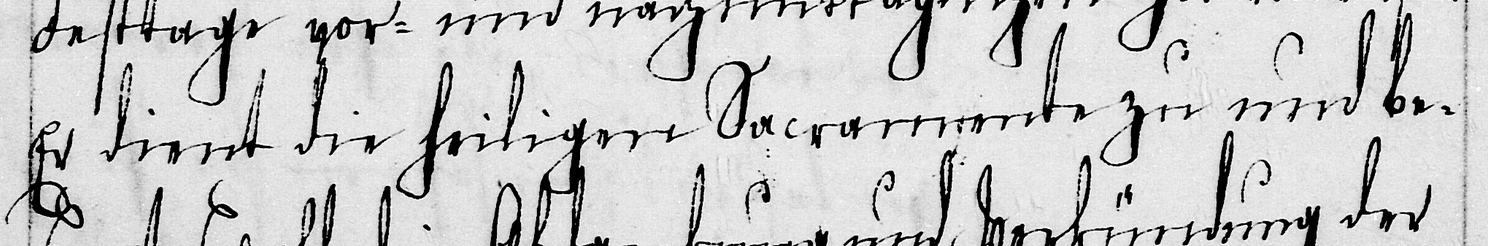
Er dient die heiligen Sacramente zu und be¬
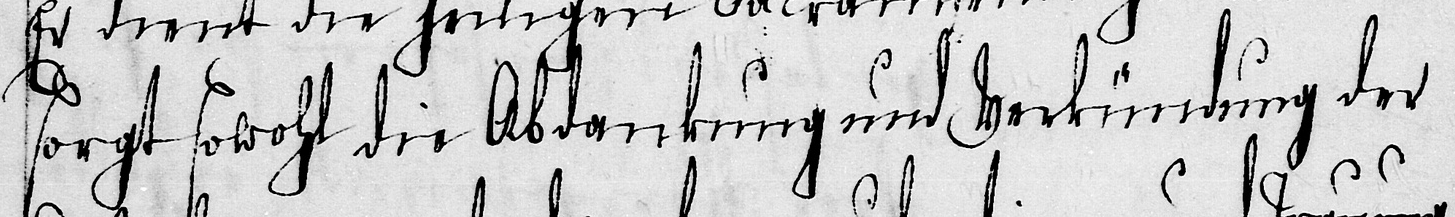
sorgt sowohl die Abdankung und Verkündung der
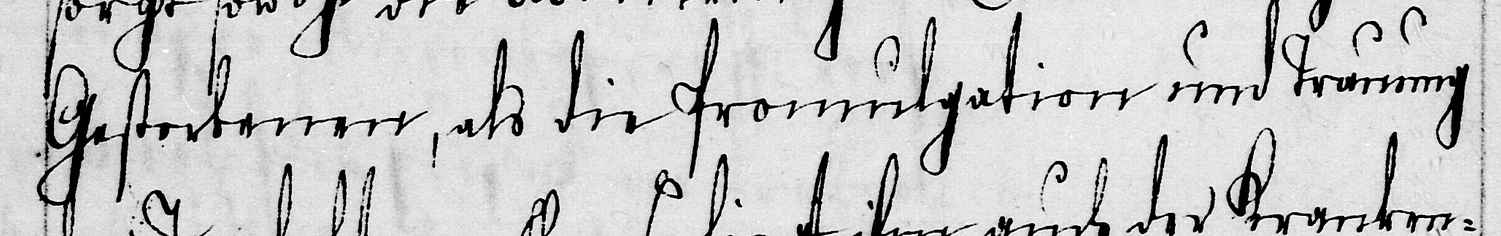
Gestorbenen, als die Promulgation und Trauung
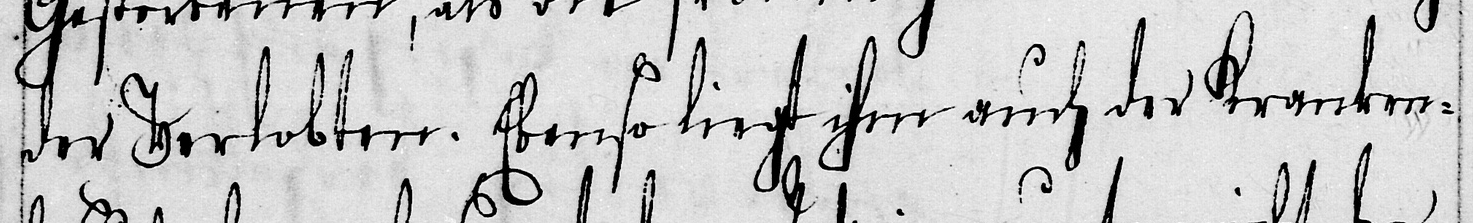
der Verlobten. Ebenso liegt ihm auch der Kranken¬
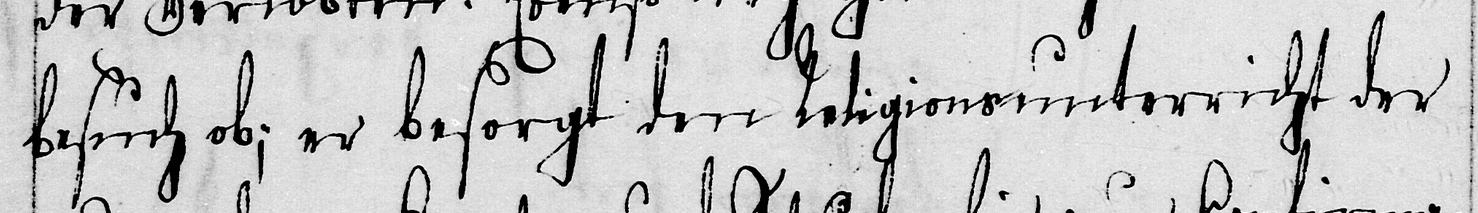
besuch ob; er besorgt den Religionsunterricht der
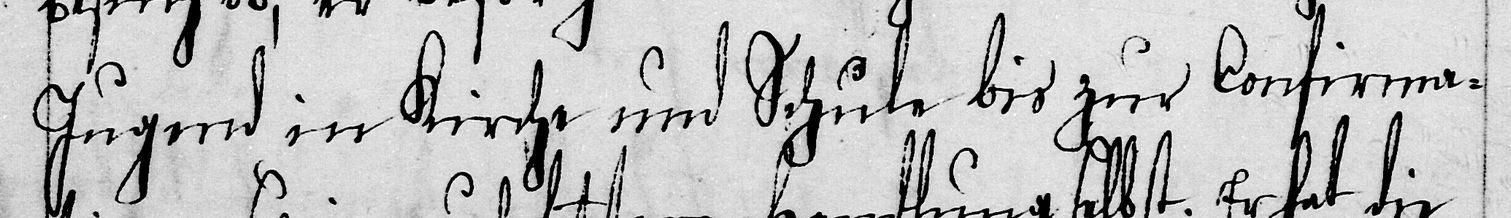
Jugend in Kirche und Schule bis zur Confirma¬
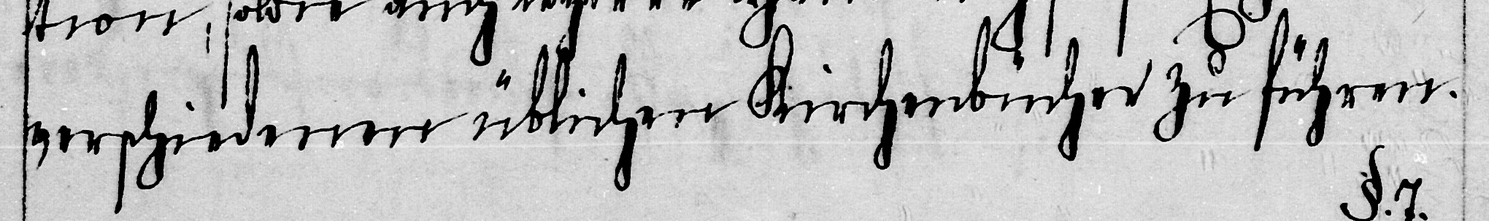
verschiedenen üblichen Kirchenbücher zu führen.
